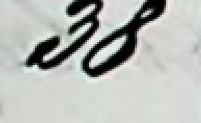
38
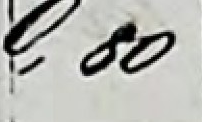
0,80
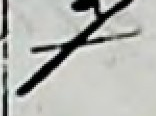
7
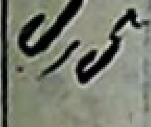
3,5
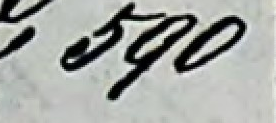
0,590
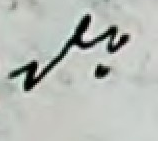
do
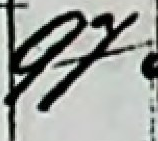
97
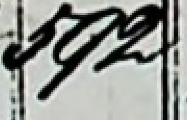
592
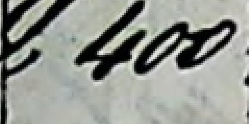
0,400
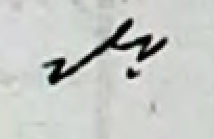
do
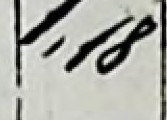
1,18
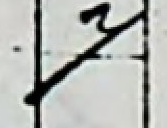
7
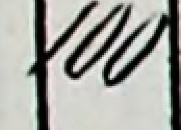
100
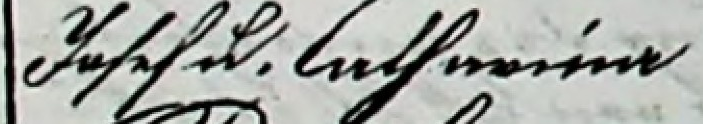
Josef u. Catharina
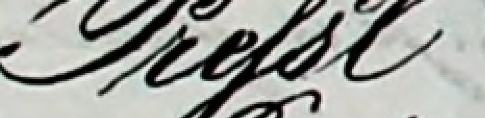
Pressl
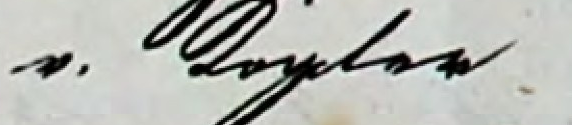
v. Kopter
